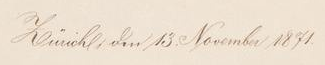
Zürich, den 13. November 1871.
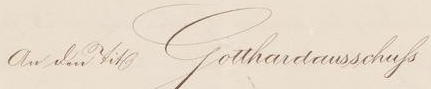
An den Tit. Gotthardausschuss
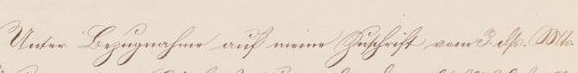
Unter Bezugnahme auf meine Zuschrift vom 3. dss. Mts.
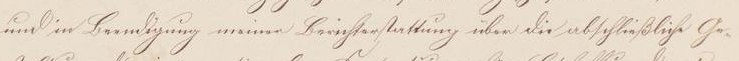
und in Beendigung meiner Berichterstattung über die abschließliche Ge-
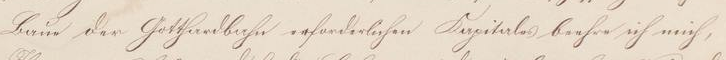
Baue der Gotthardbahn erforderlichen Kapitales beehre ich mich,
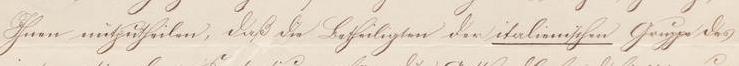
Ihnen mitzutheilen, daß die Betheiligten der italienischen Gruppe des
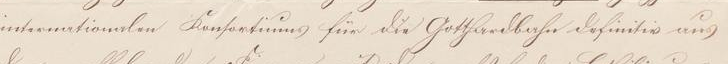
internationalen Konsortiums für die Gotthardbahn definitiv aus
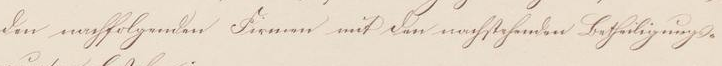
den nachfolgenden Firmen mit den nachstehenden Betheiligungs-
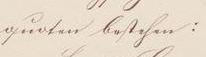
quoten bestehen:
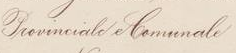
Provinciale e Comunale
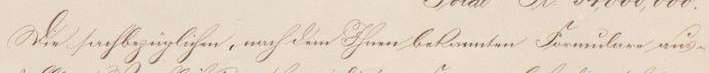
Die sachbezüglichen, nach dem Ihnen bekannten Formulare aus-
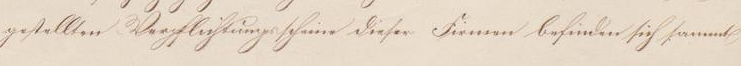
gestellten Verpflichtungsscheine dieser Firmen befinden sich sammt
